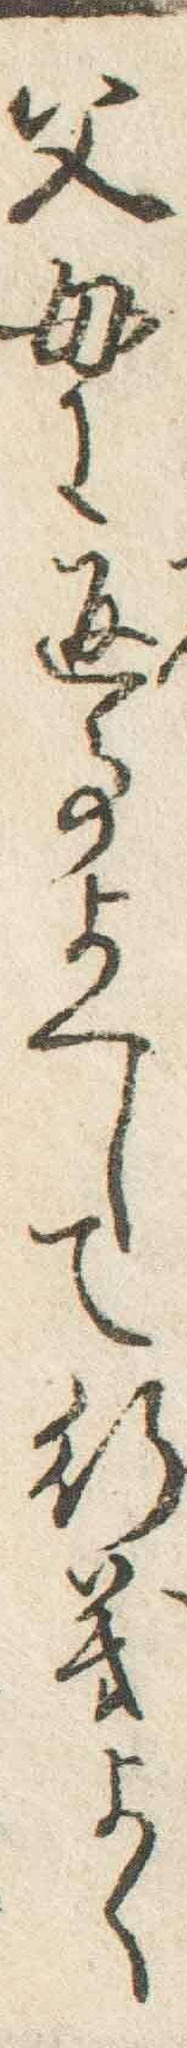父母に返事よくして行義よく
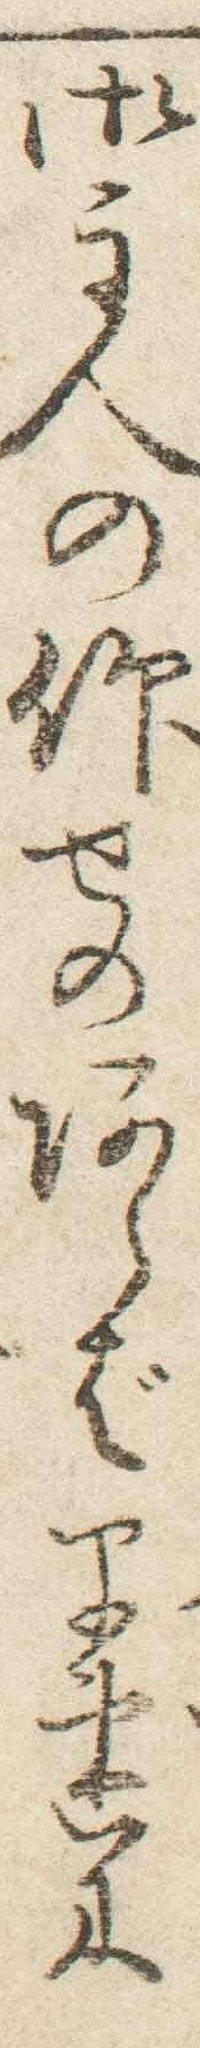御主人の仰せのあらば早速に
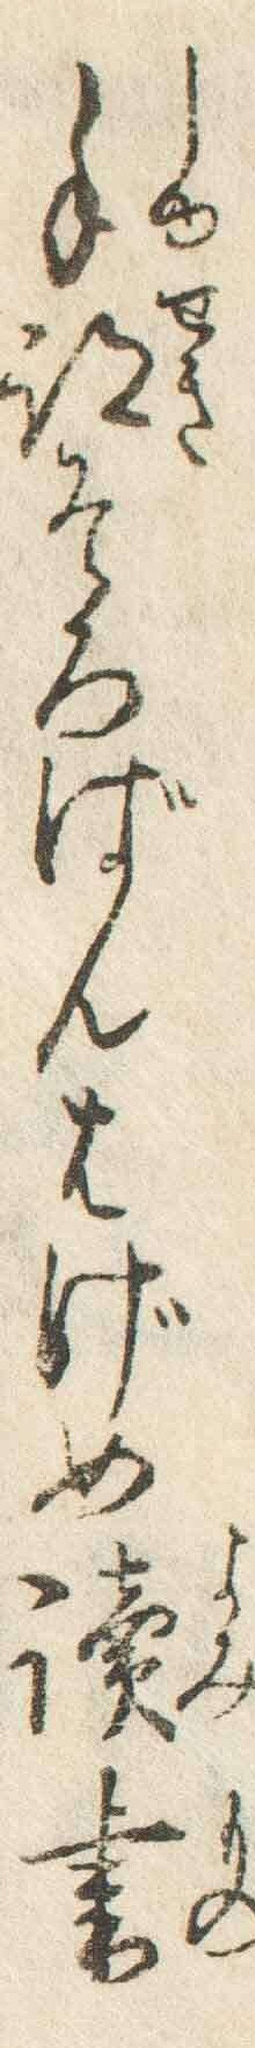手跡そろばんはげめ読書
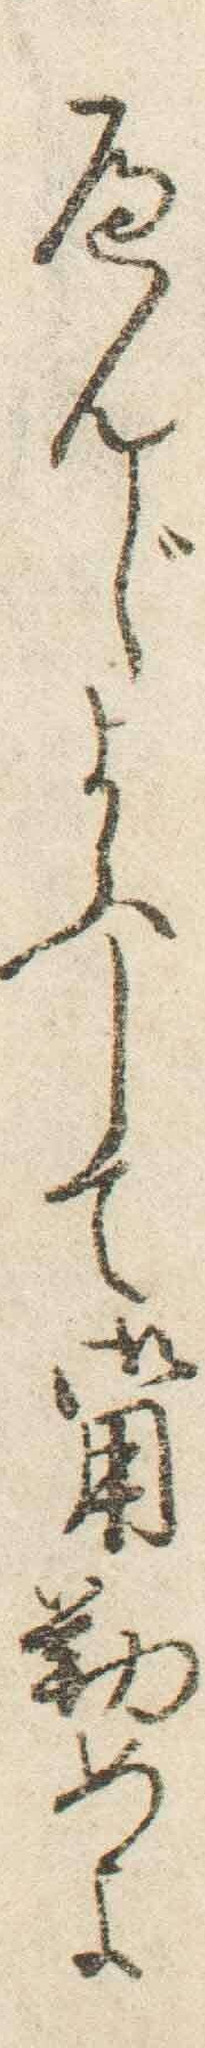へんじよふして御用勤めよ
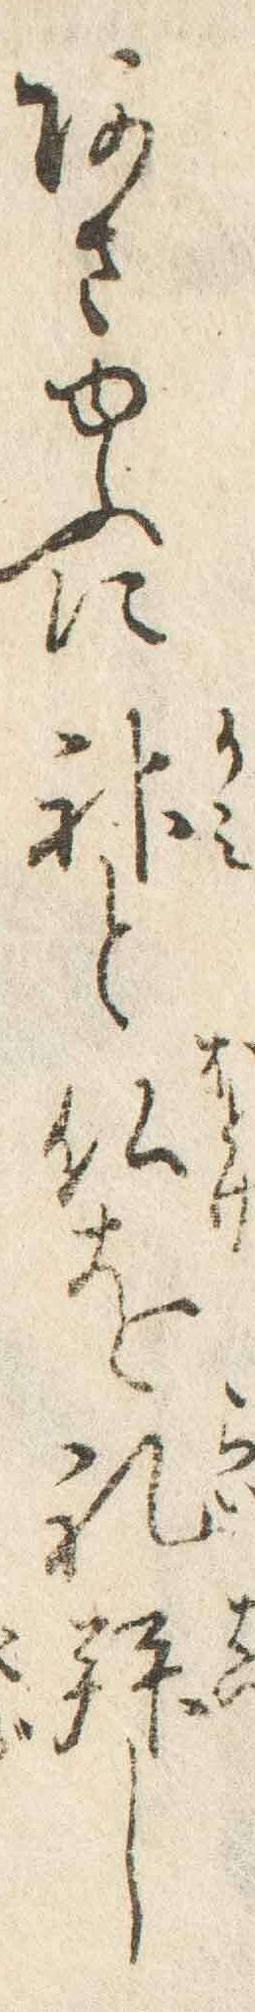あさゆふに神と仏を礼拝し
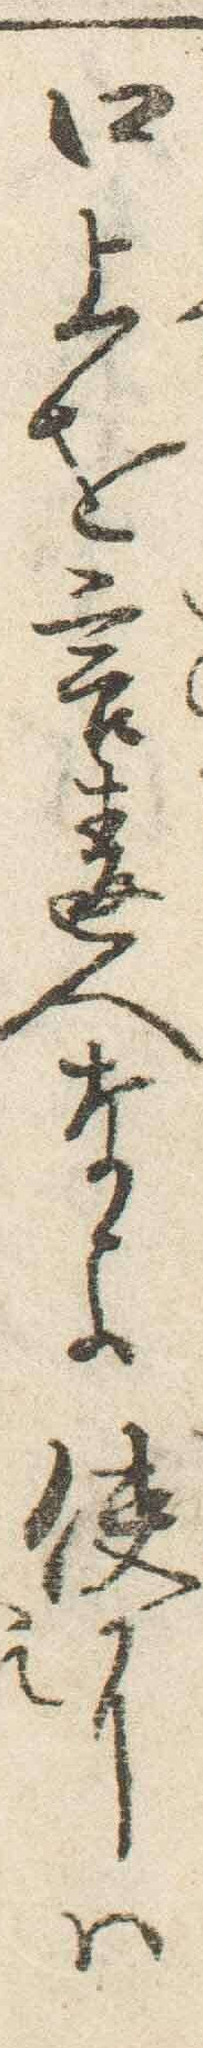口上を言違へなよ使には
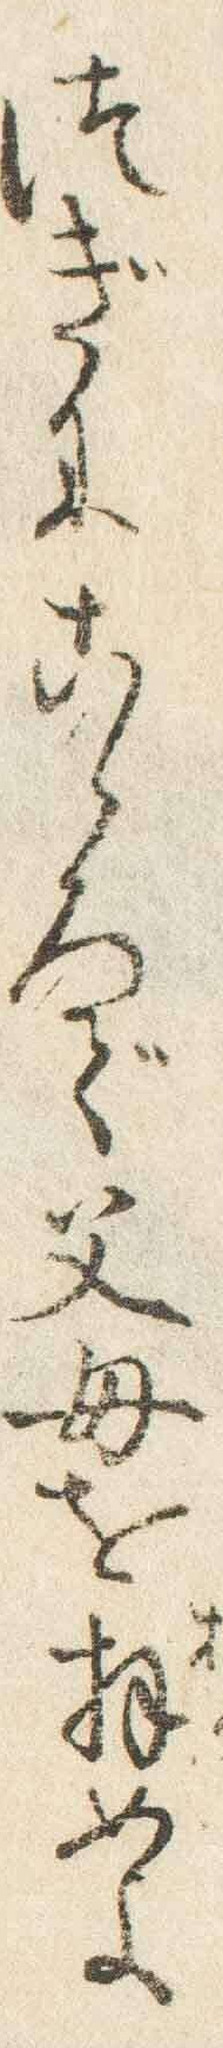つぎにこゝろで父母を拝めよ
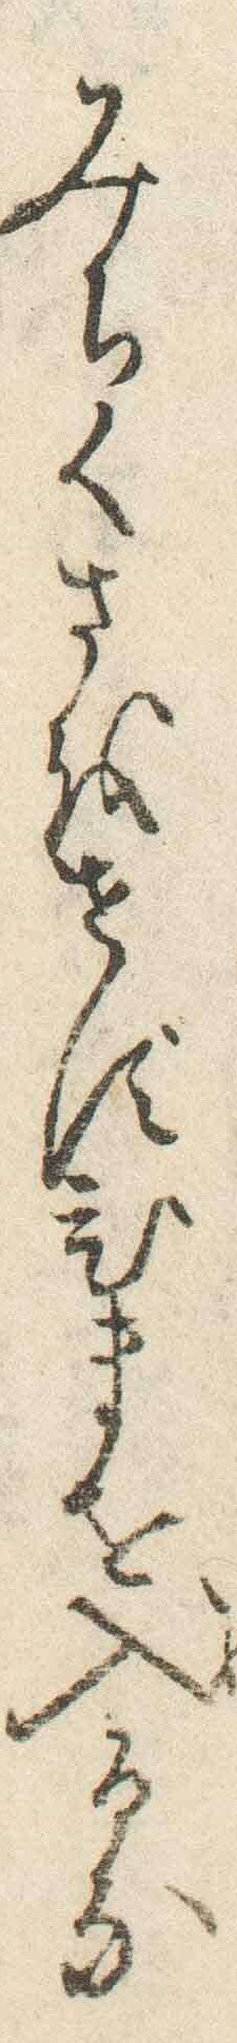みちくさをせずひまを入るな
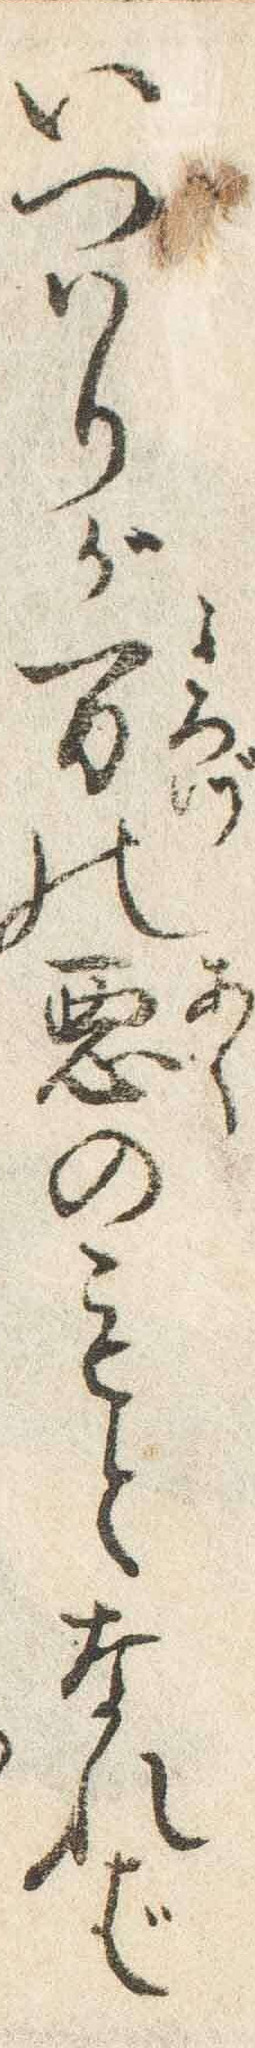いつはりが万の悪のもとなれば
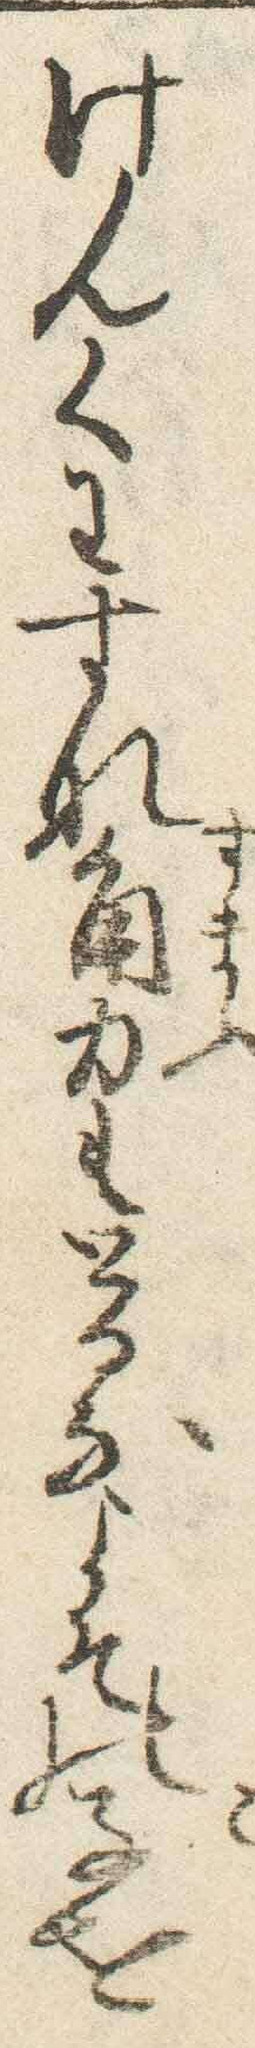けんくわすな角力もとるなよその子を
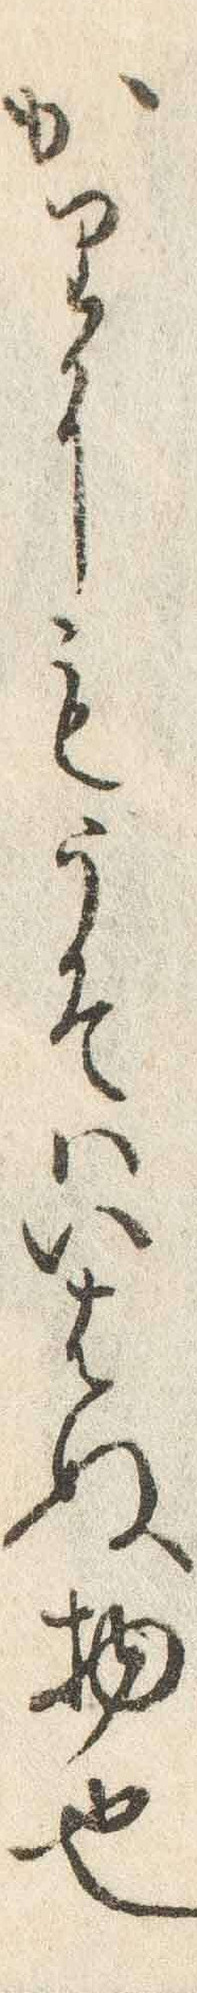かりにもうそはいはぬ物也
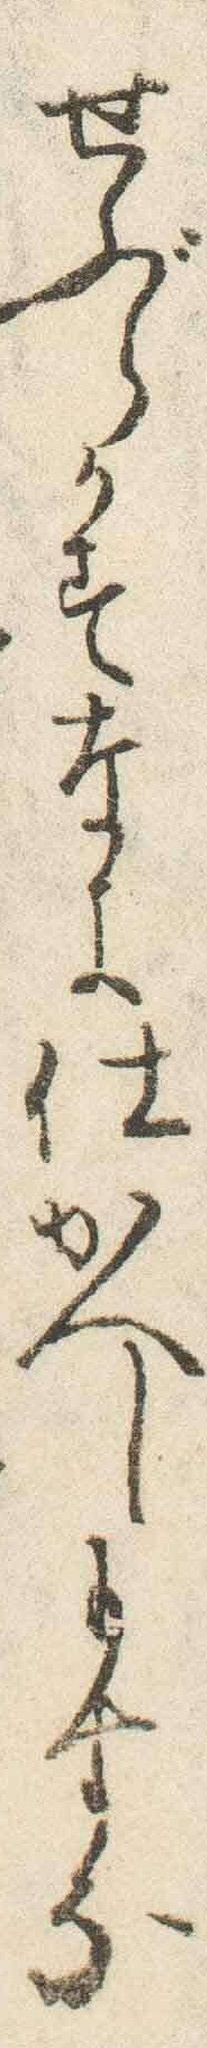せぶらかすなよ仕かへしもすな
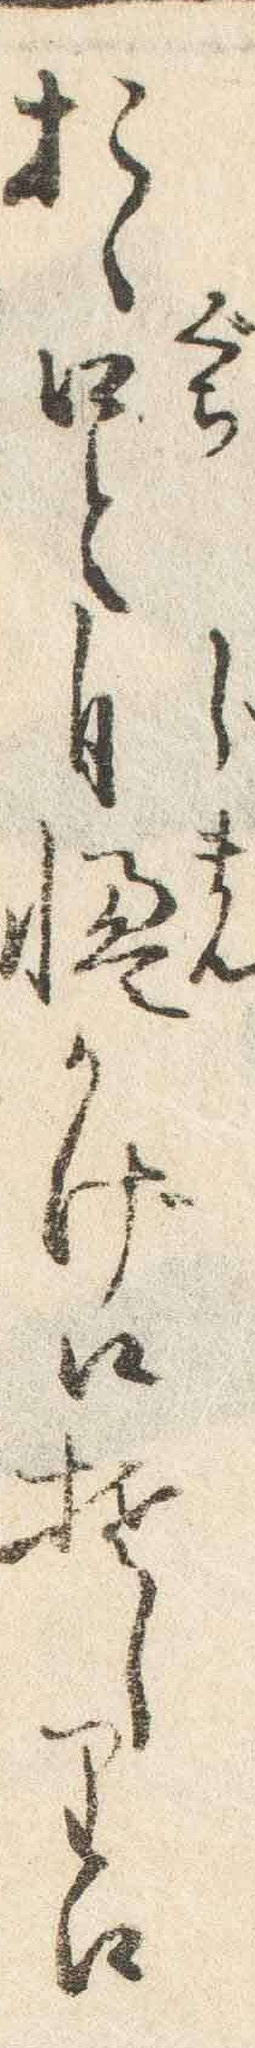おゝ口と自慢かげ口そしり口
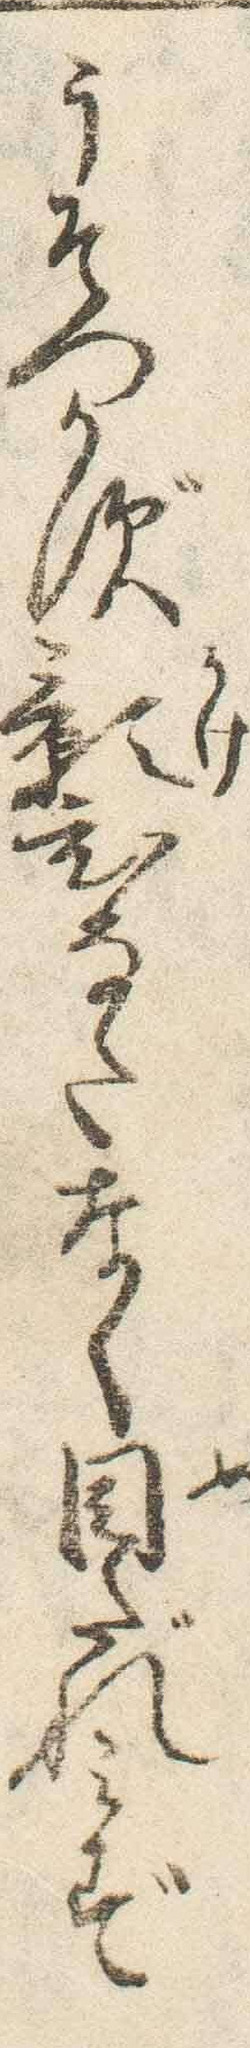うそつかず影ひなたなく目だれみず
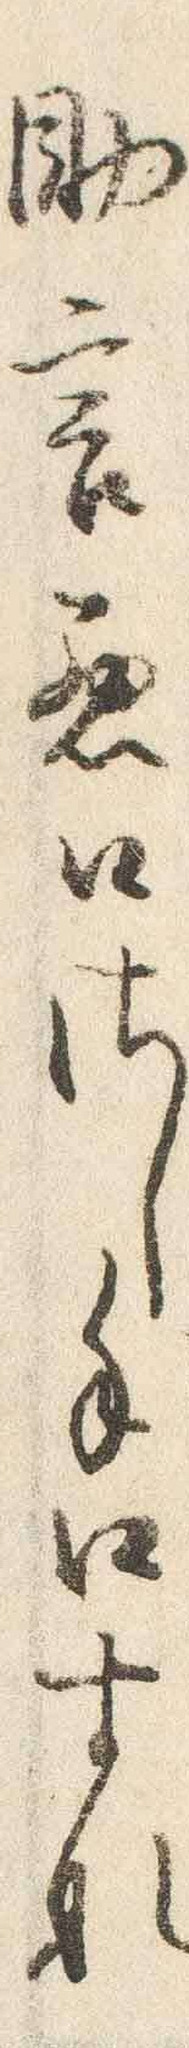助言悪口さし手口すな
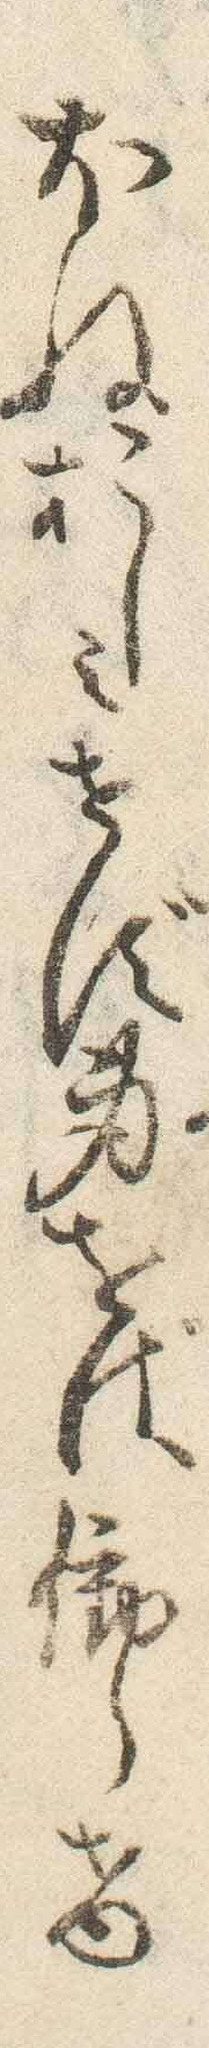ほねおしみせず身をば働らけ
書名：撫育草
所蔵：東京学芸大学附属図書館 国文学研究資料館
